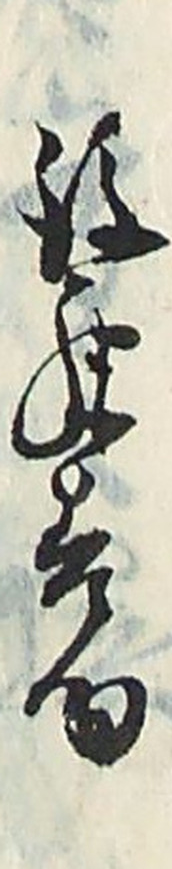後藤善助
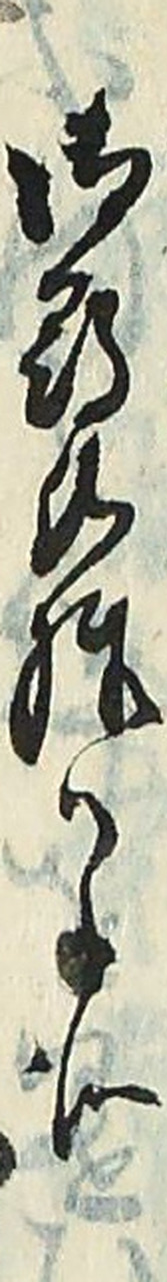御郡代様御手代
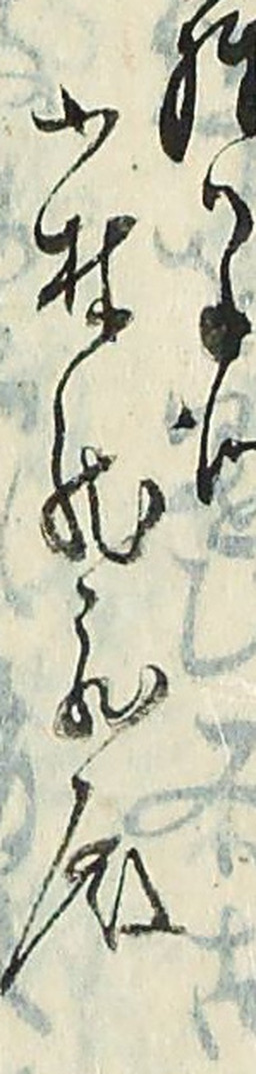小林龍三殿
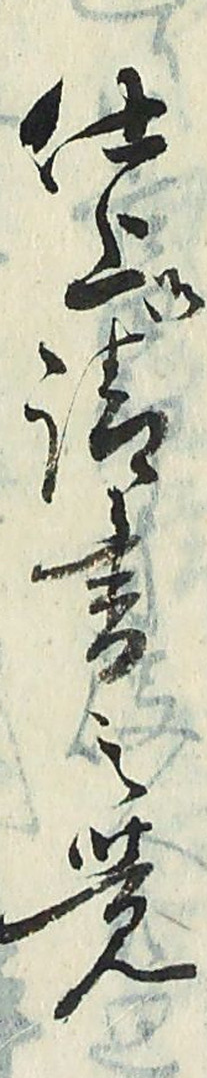仕上御請書之覚
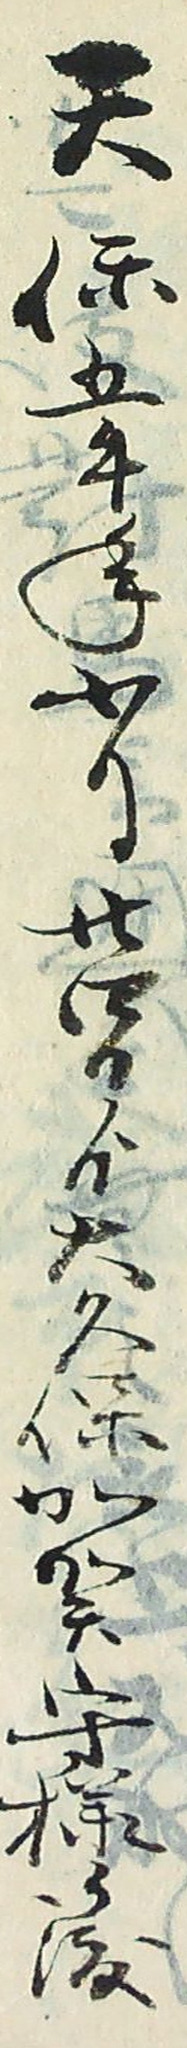天保五午年五月廿四日ゟ大久保加賀守様御渡
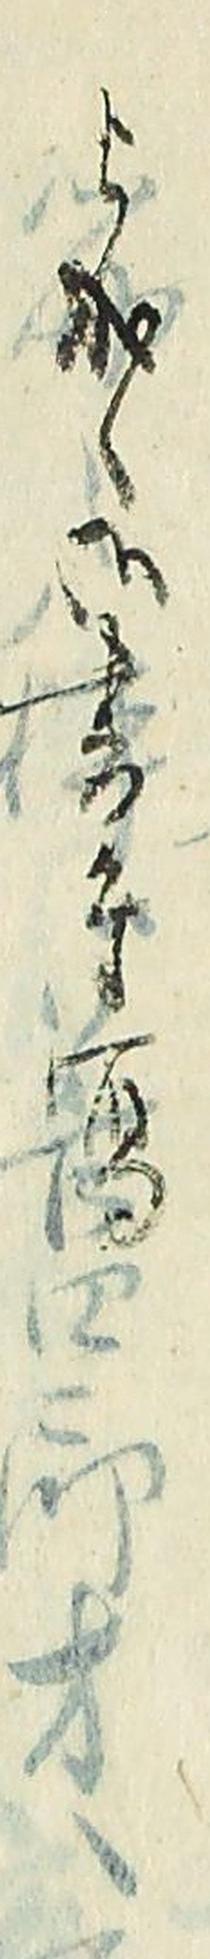被成候御書付写
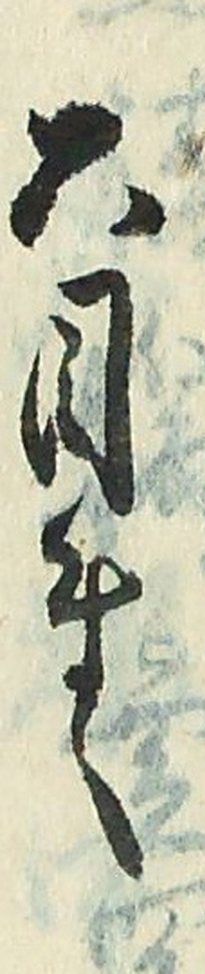大目付へ
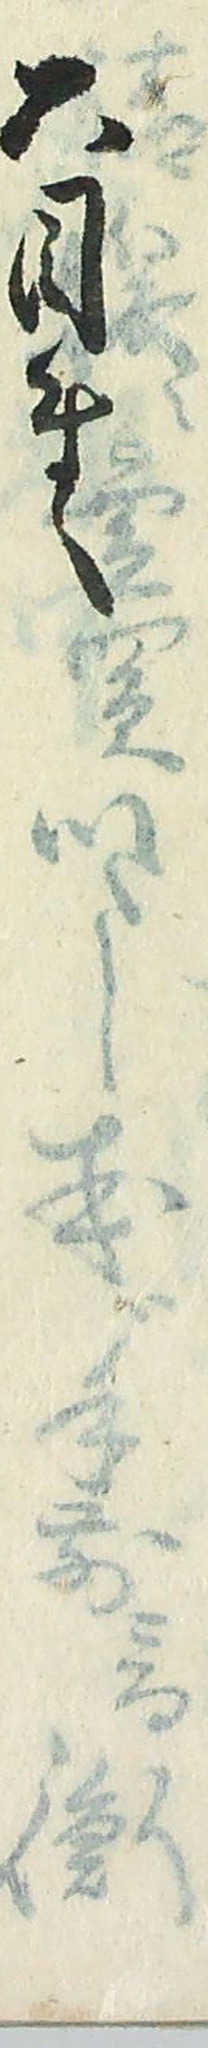大目付へ
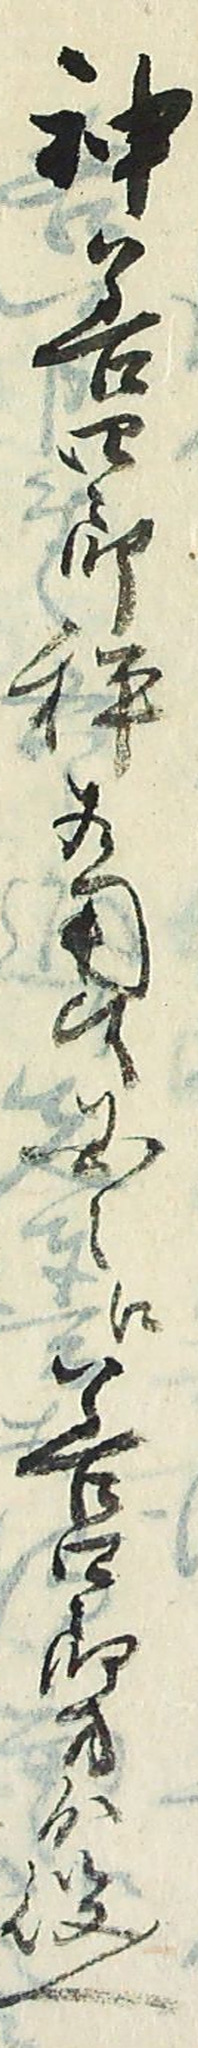神善四郎秤相用候国々江善四郎方ゟ役人
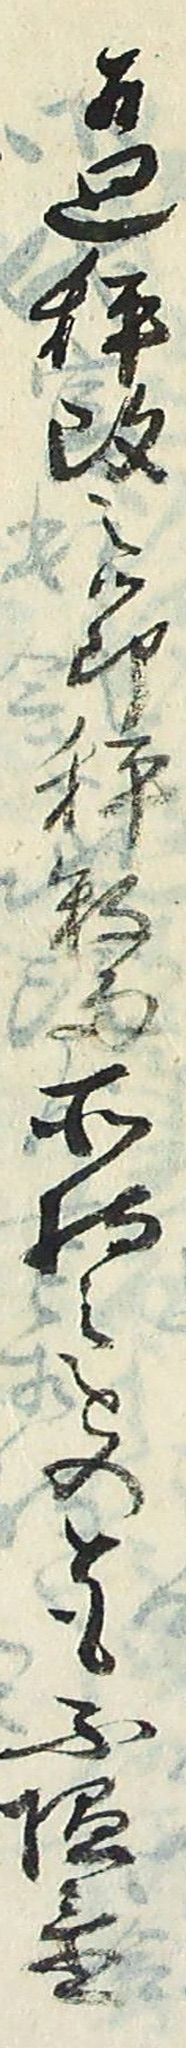相廻秤改之節秤数多所持のものとも不隠置
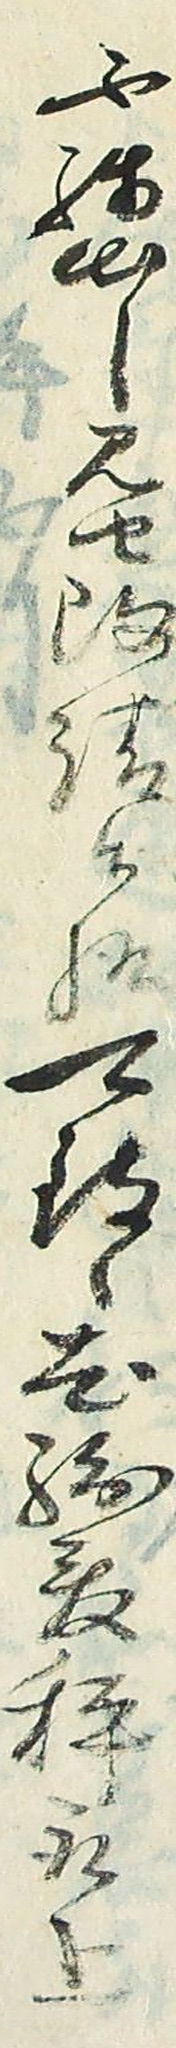不残出し見せ改請候様可致候尤紛敷秤取上
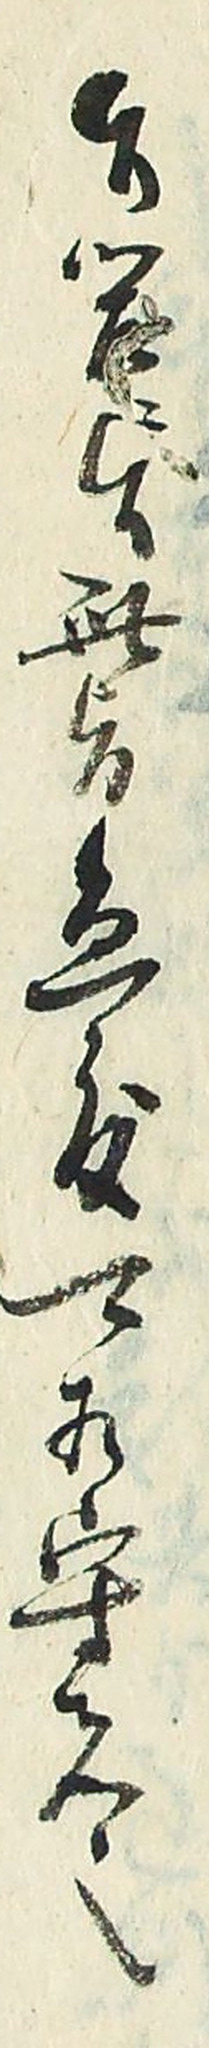候筈に候此旨急度可相守者也
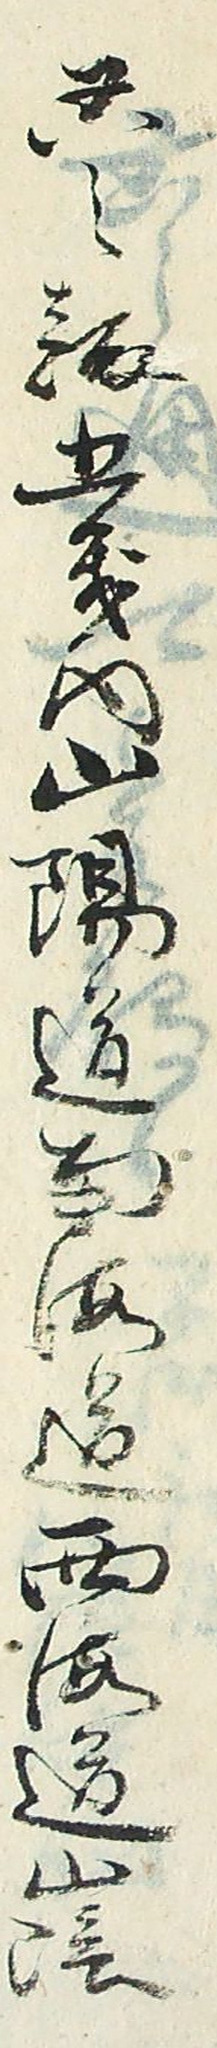右之趣五幾内山陽道南海道西海道山陰
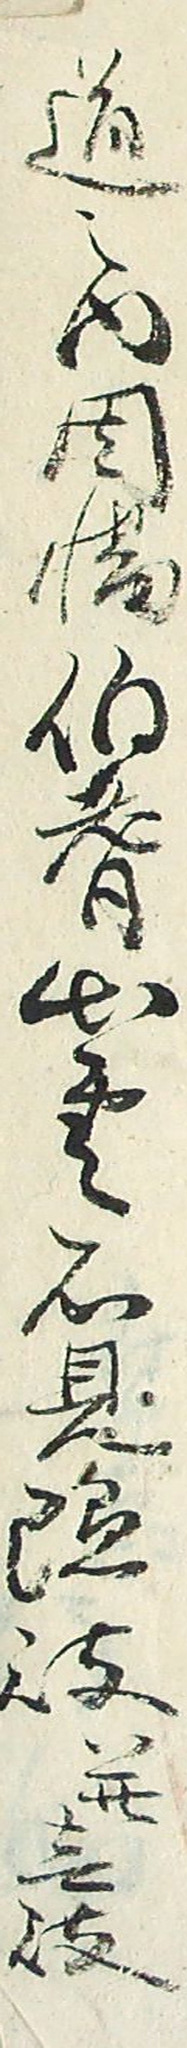道之内因幡伯耆出雲石見隠岐幷壱岐

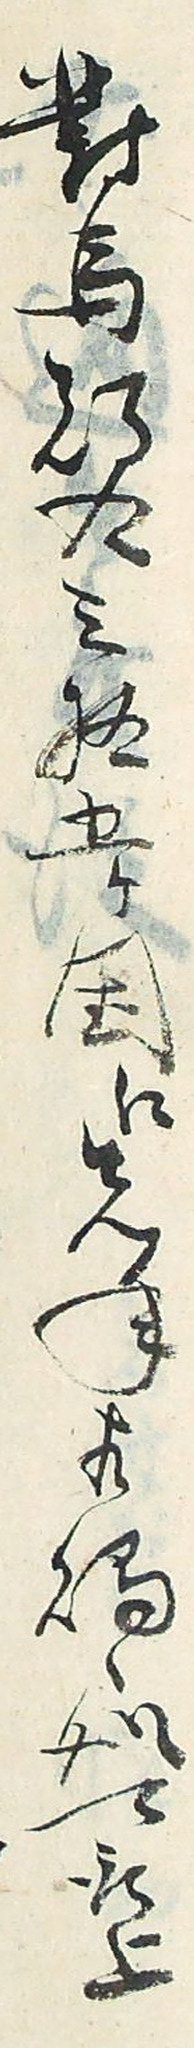対島都合三拾五ケ国へ先年相触候処可取上
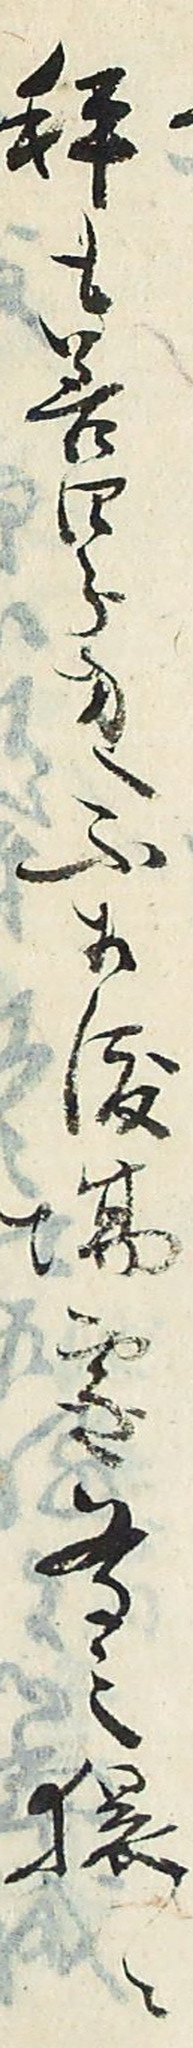秤も善四郎方へ不相渡場処有之猥に
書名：諸御用御□受書控
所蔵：鳴門教育大学 Naruto University of Education
